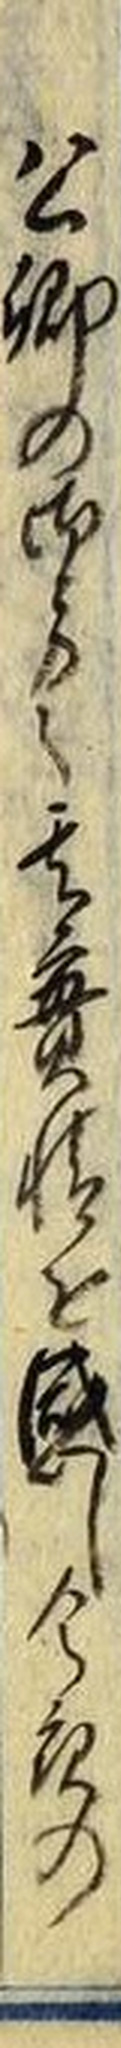公卿の御方之其実情を感し今夜の
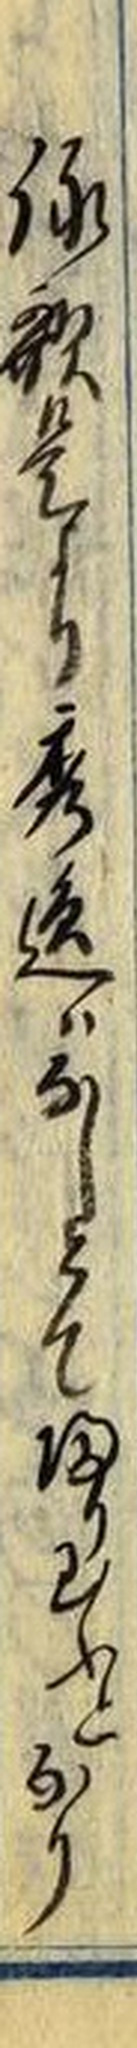詠歌是より秀逸ハなしとて帰り玉ふとなり
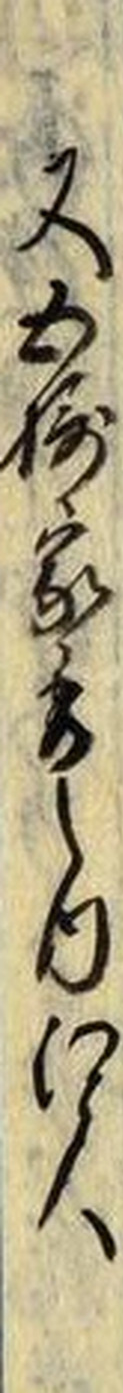又五摂家方之内江戸へ

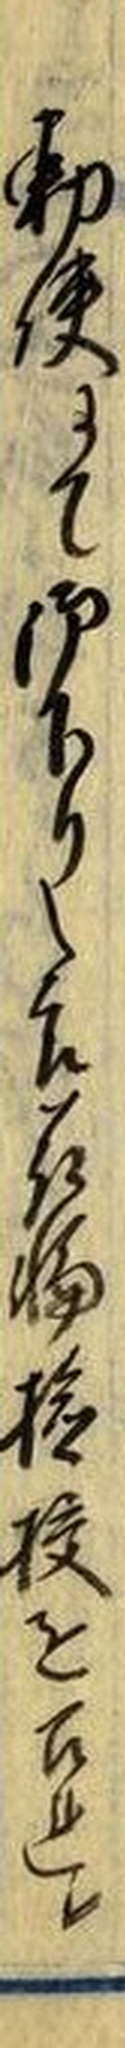勅使にて御下り之節花輪検校を召連れ
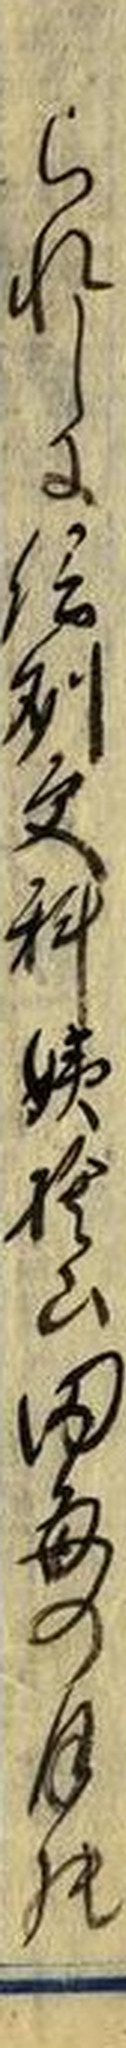られしに信州更科姨捨山田毎の月の
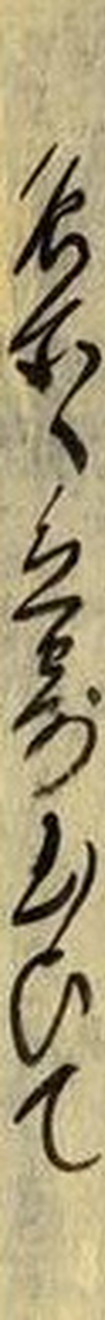名所々へ立寄玉ひて
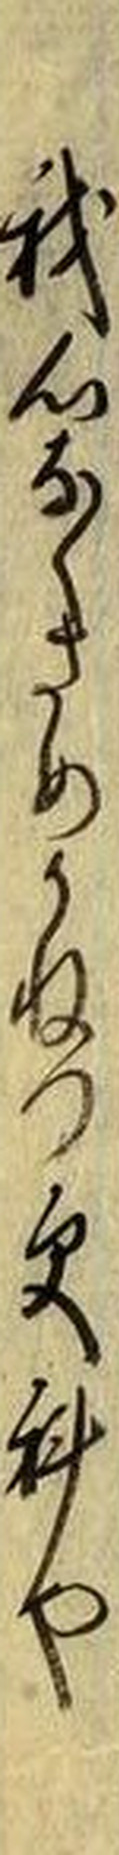我心なくさめかねつ更科や
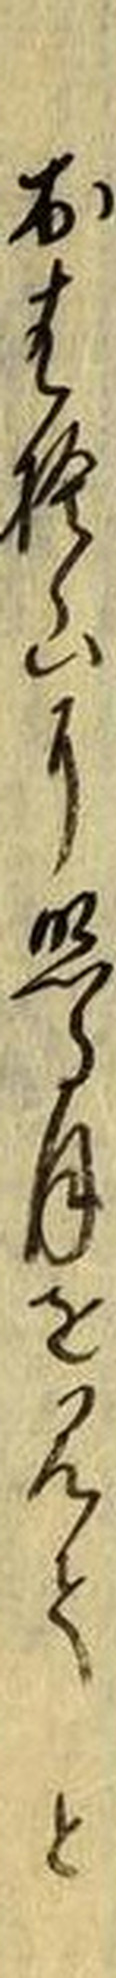おは捨山に照る月を見てと
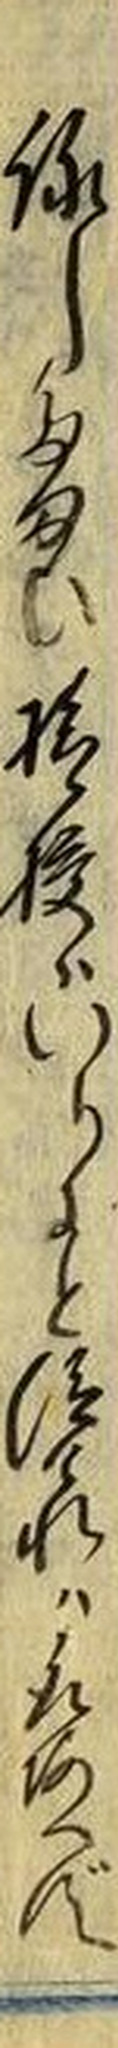詠したまひ検校はいかにと仰けれは取あへず
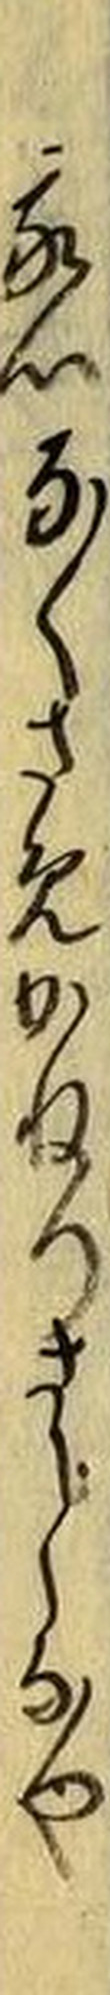我心なくさめかねつさらしなや
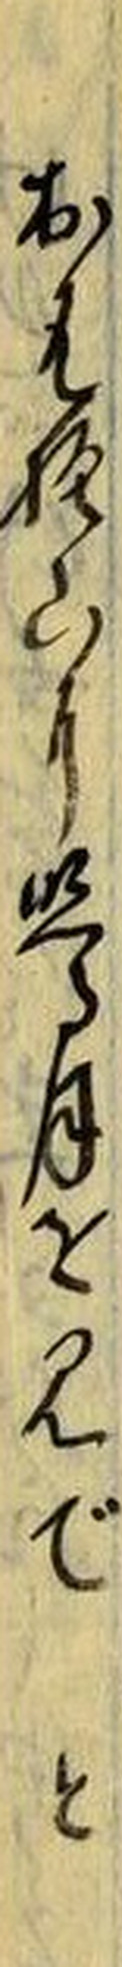おは捨山に照る月を見でと
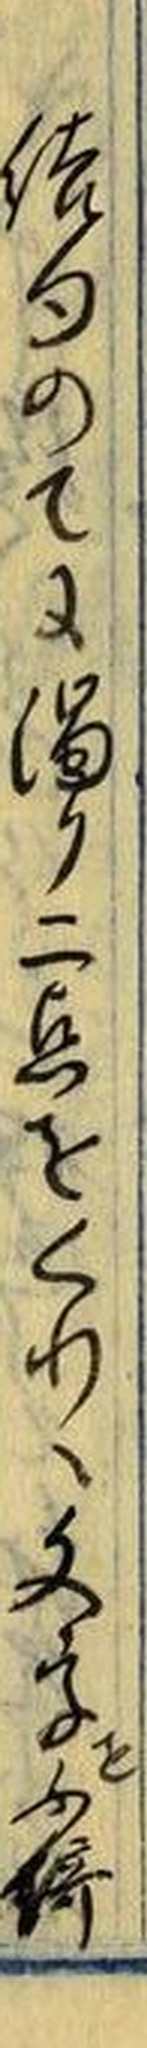結句のてに濁り二点をくわへ文字を不綺
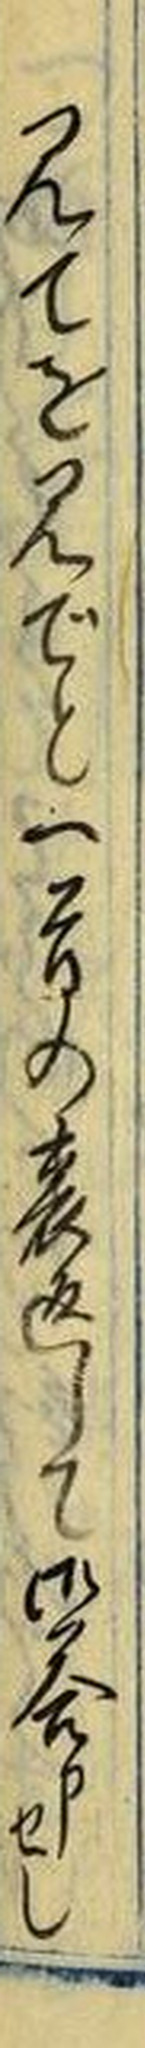見てを見でと一音の裏返して御答申せし
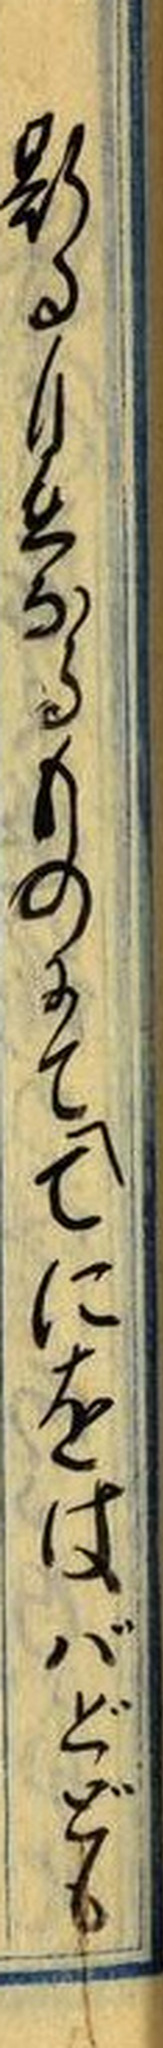斯る自在なるものにて「てにをはばどども
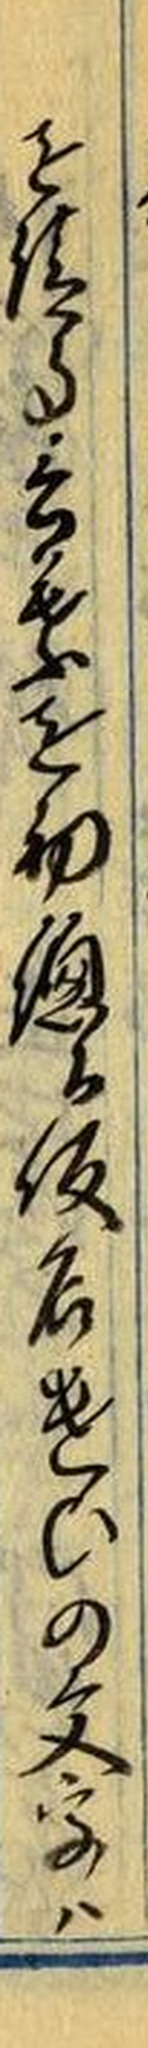を請る言葉を初総而仮名遣ひの文字は
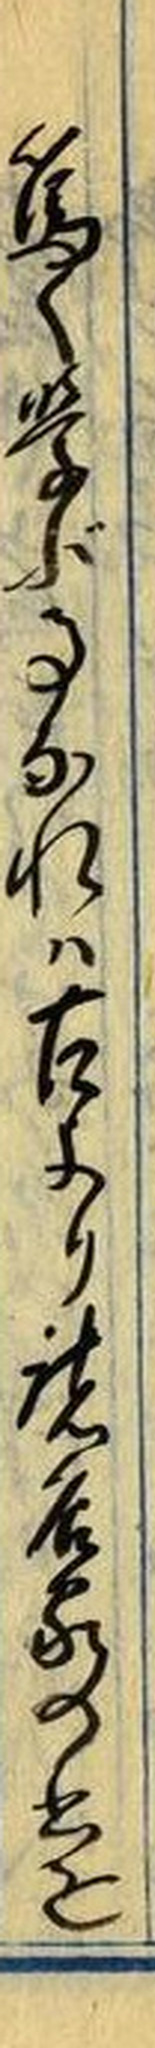篤く学ぶ事なれは古より諸名家の書を
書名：温古集 三巻
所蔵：福井県文書館 Fukui Prefectural Archives
